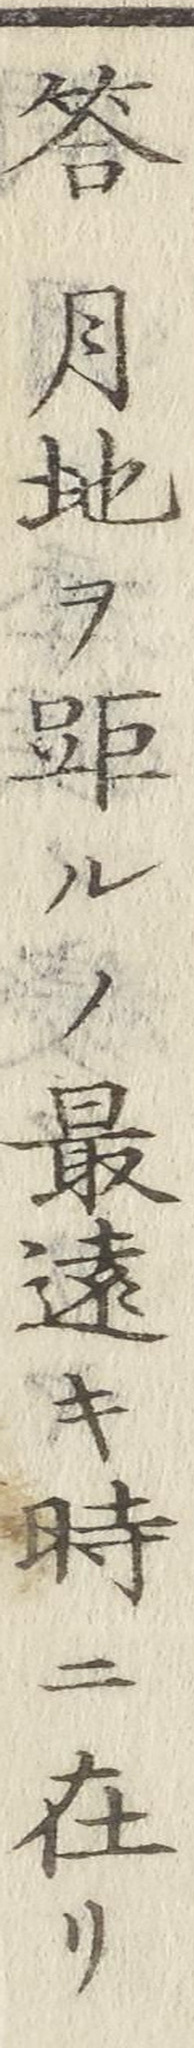答月地ヲ距ルノ最遠キ時ニ在リ
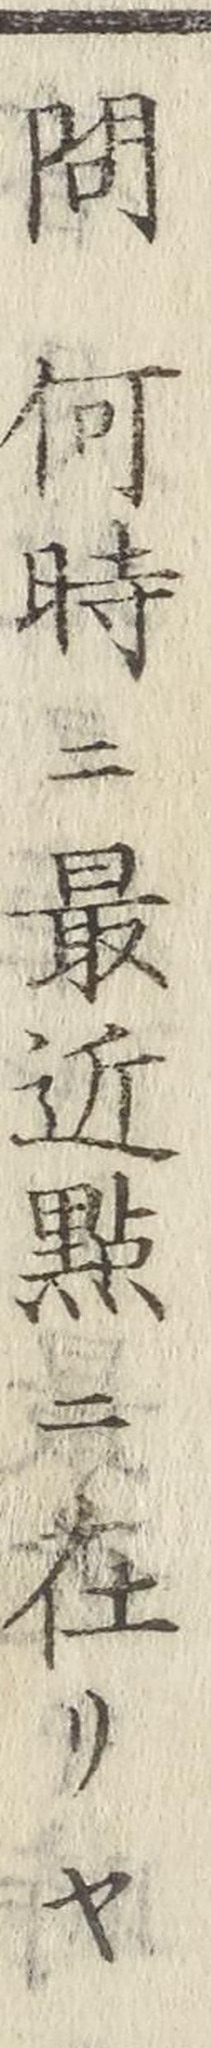問何時ニ最近点ニ在リヤ

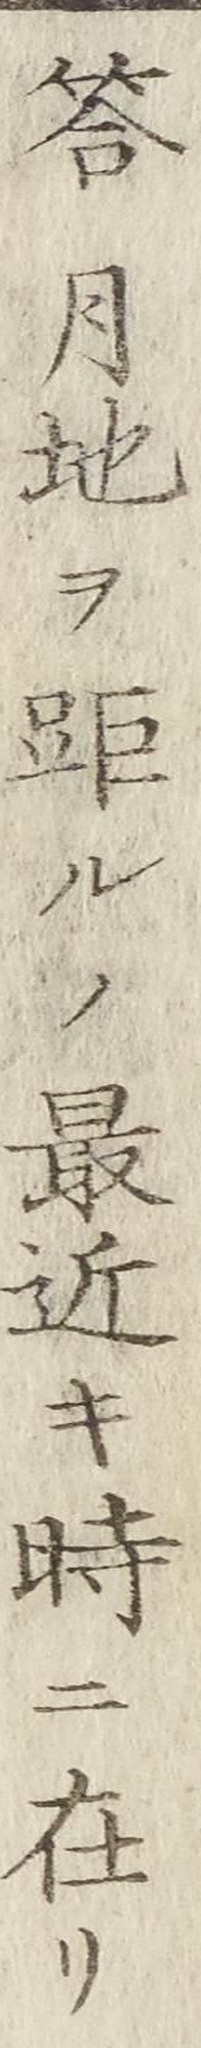答月地ヲ距ルノ最近キ時ニ在リ
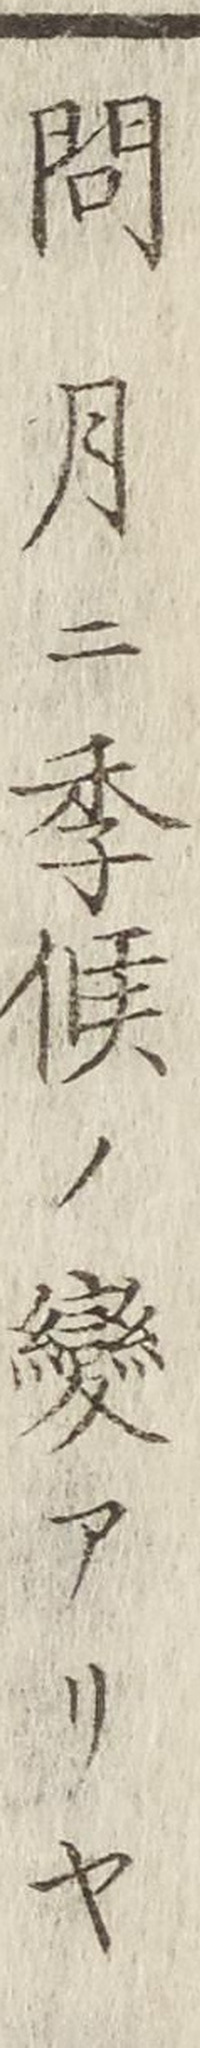問月ニ季候ノ変アリヤ
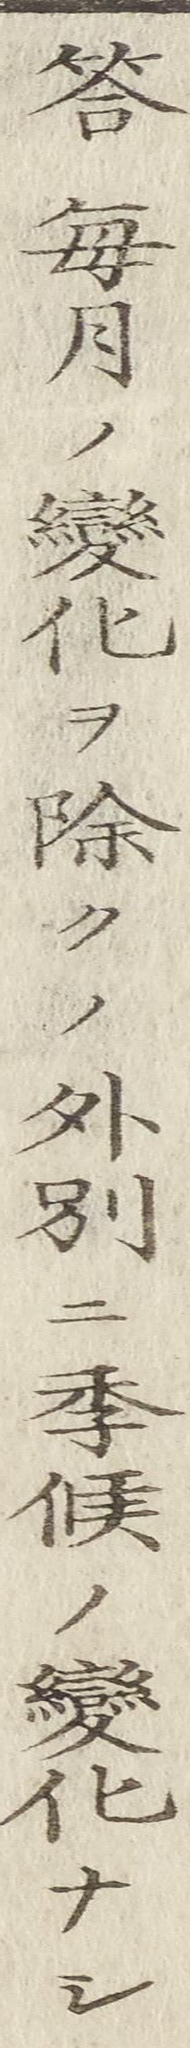答毎月ノ変化ヲ除クノ外別ニ季候ノ変化ナシ
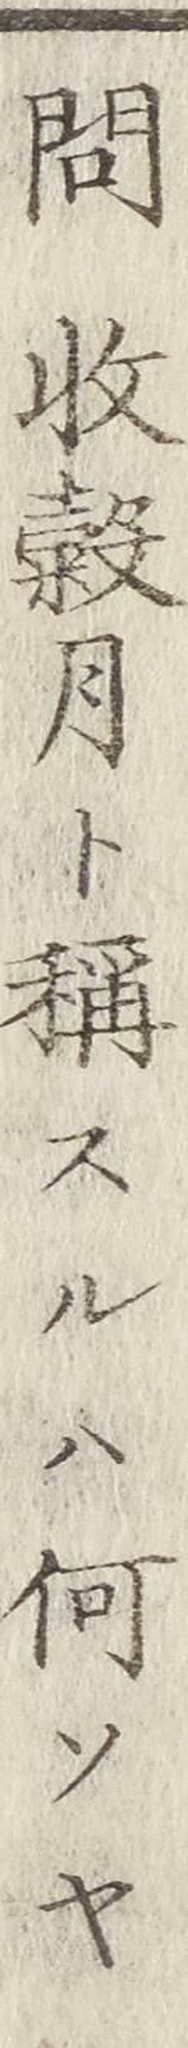問収穀月ト称スルハ何ソヤ
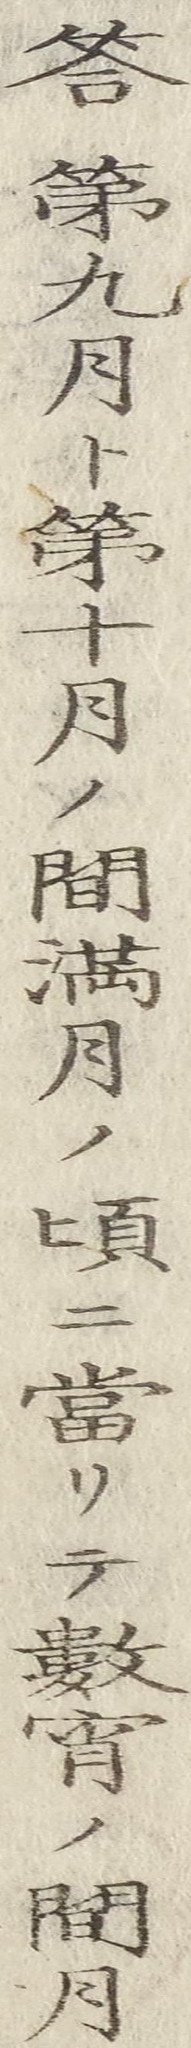答第九月ト第十月ノ間満月ノ頃ニ当リテ数宵ノ間月
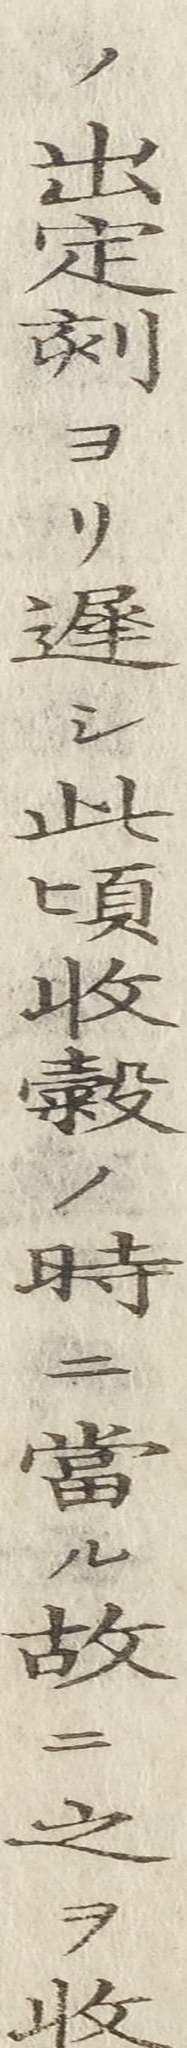ノ出定刻ヨリ遅シ此頃収穀ノ時ニ当ル故ニ之ヲ収
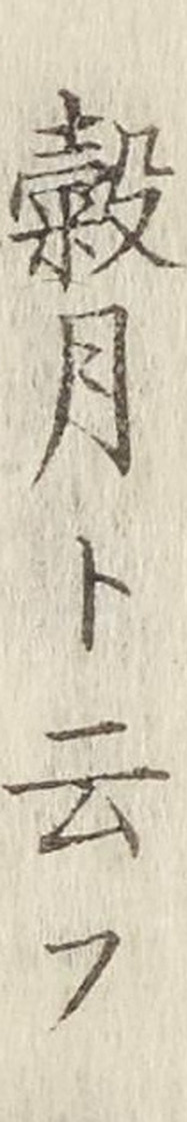穀月ト云フ
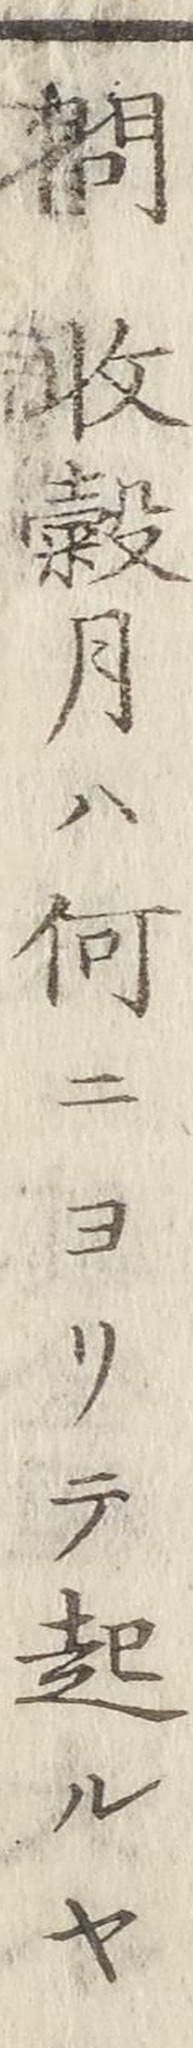問収穀月ハ何ニヨリテ起ルヤ
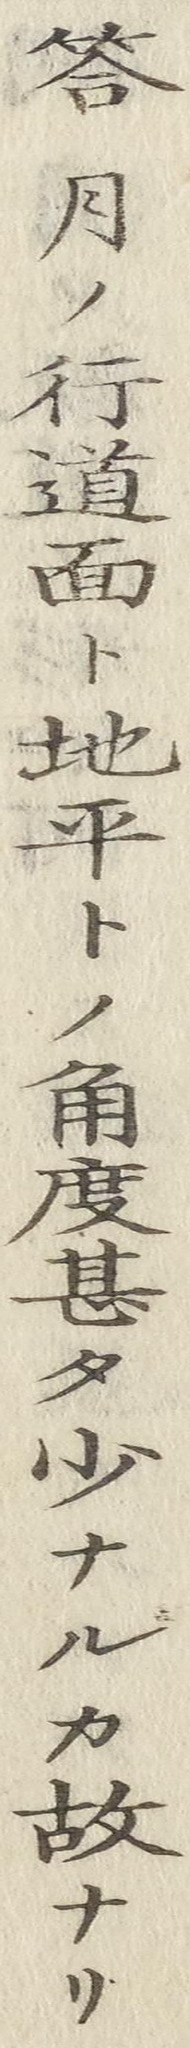答月ノ行道面ト地平トノ角度甚タ少ナルカ故ナリ
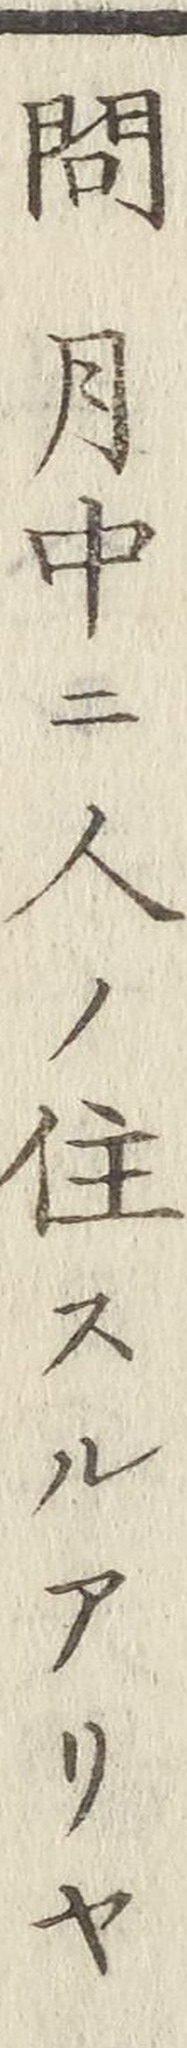問月中ニ人ノ住スルアリヤ
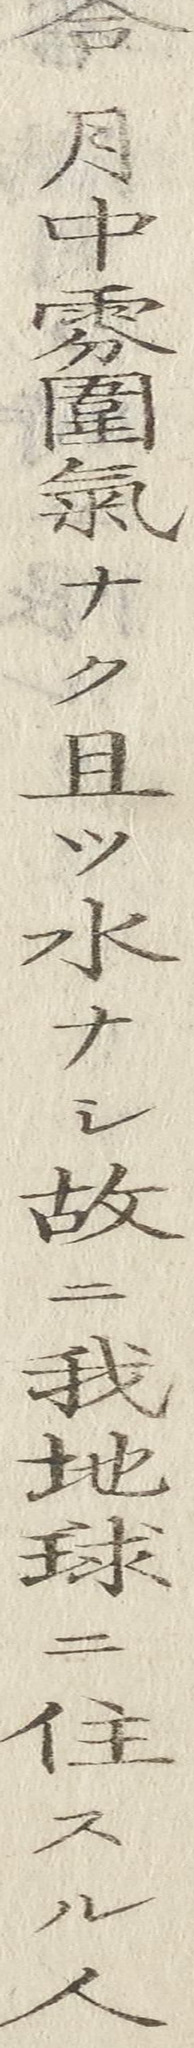答月中雰囲気ナク且ツ水ナシ故ニ我地球ニ住スル人
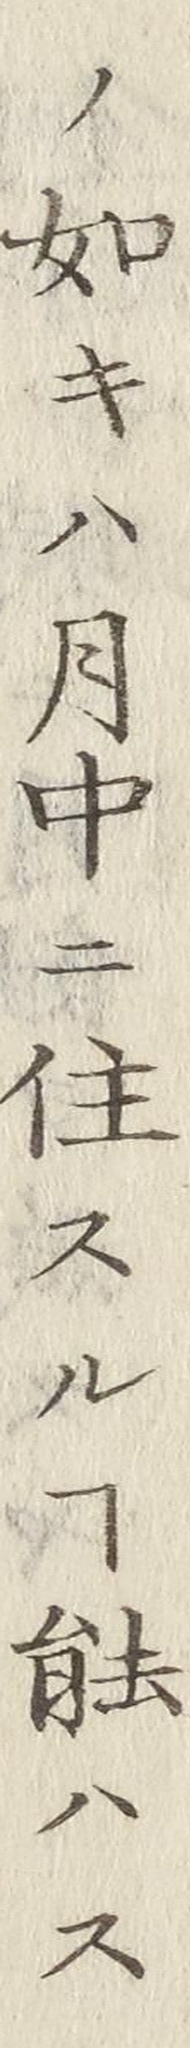ノ如キハ月中ニ住スルコト能ハス
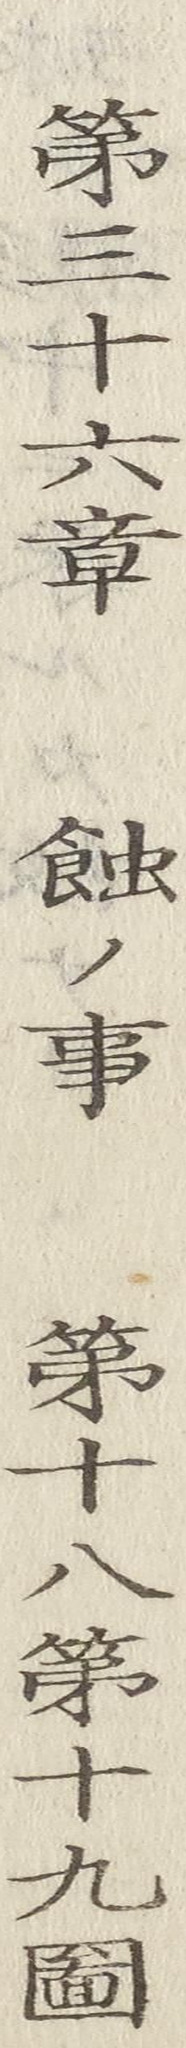第三十六章蝕ノ事第十八第十九図
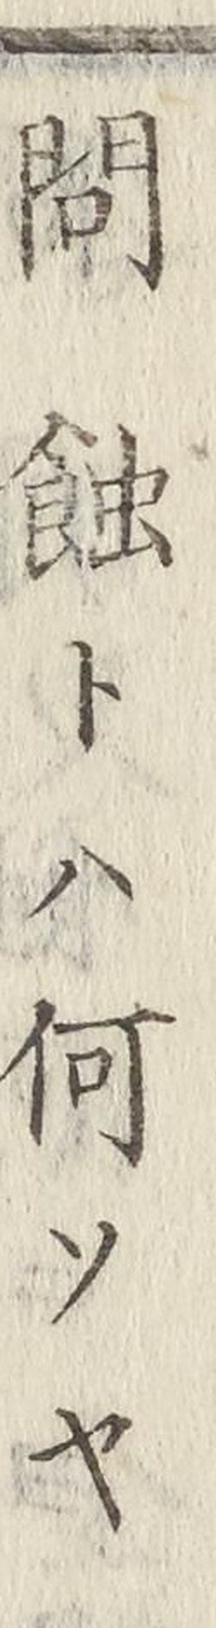問蝕トハ何ソヤ
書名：星学圖説　下
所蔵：東京大学地震研究所図書室 Earthquake Research Institute Library, The University of Tokyo, JAPAN
